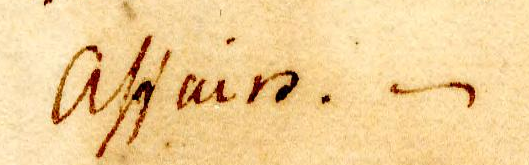Affairs.-
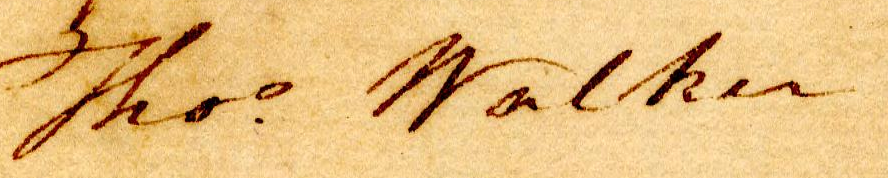Tho^s. Walker
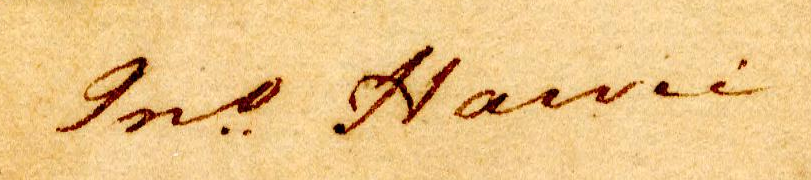Jn^o. Harvie
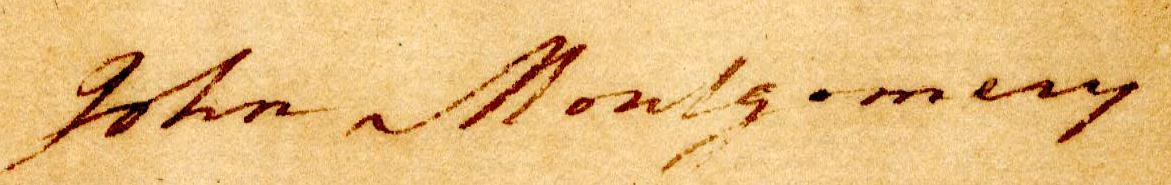John Montgomery
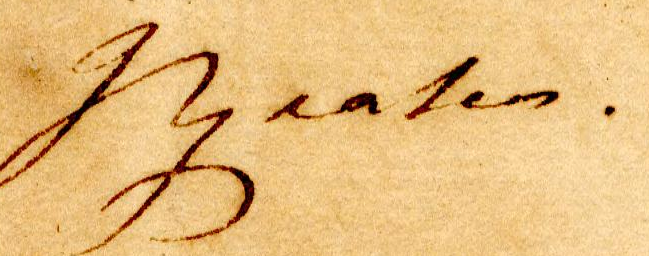J Yeates.
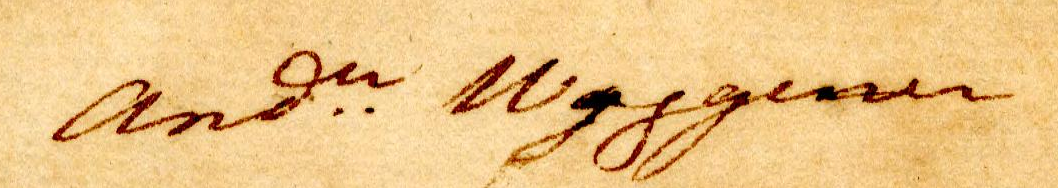And^w. Wyggener
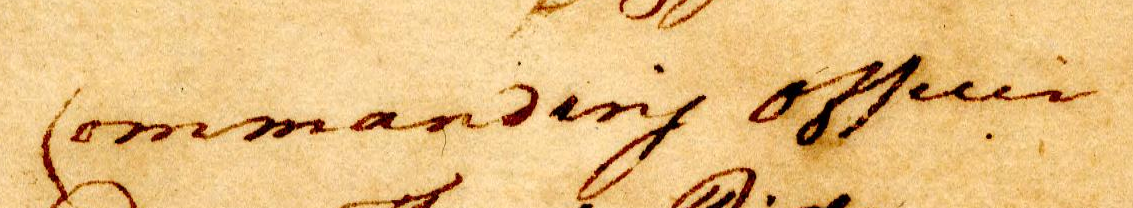Commanding officer
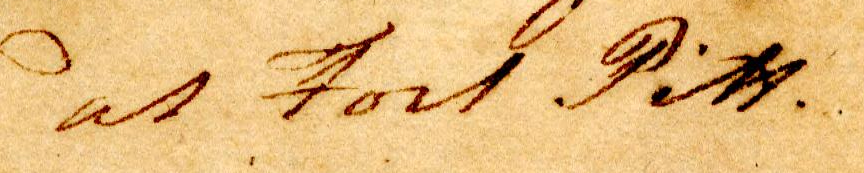at Fort Pitt.
